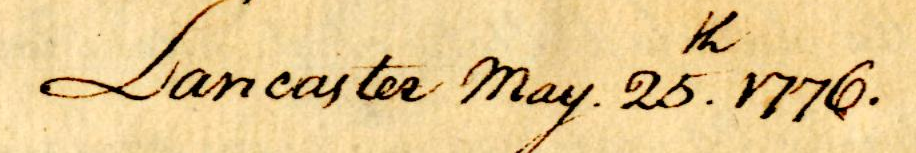Lancaster May. 25^th. 1776.
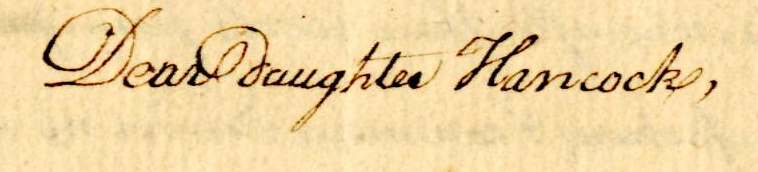Dear daughter Hancock,
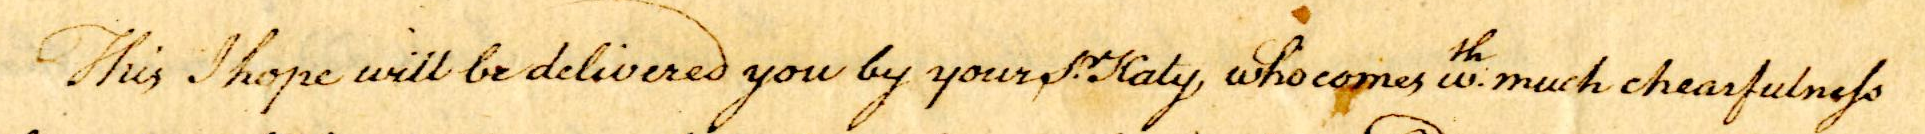This I hope will be delivered you by your S^r. Katy who comes w^th. much chearfulness
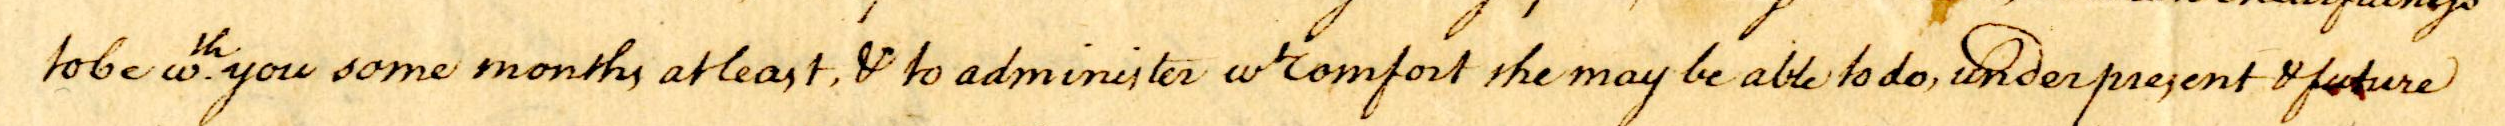to be w^th. you some months at least, & to administer w^t Comfort she may be able to do, under present & future
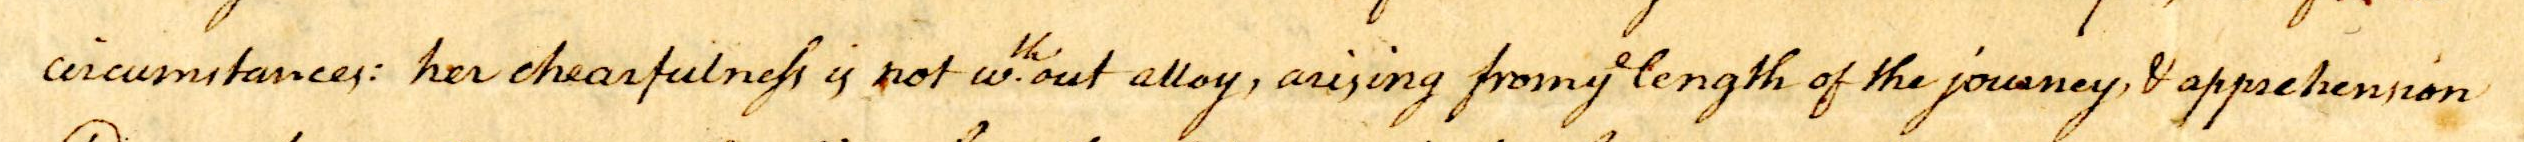circumstances: her chearfulness if not w^th. out alloy, arising from y^e length of the journey, & apprehension
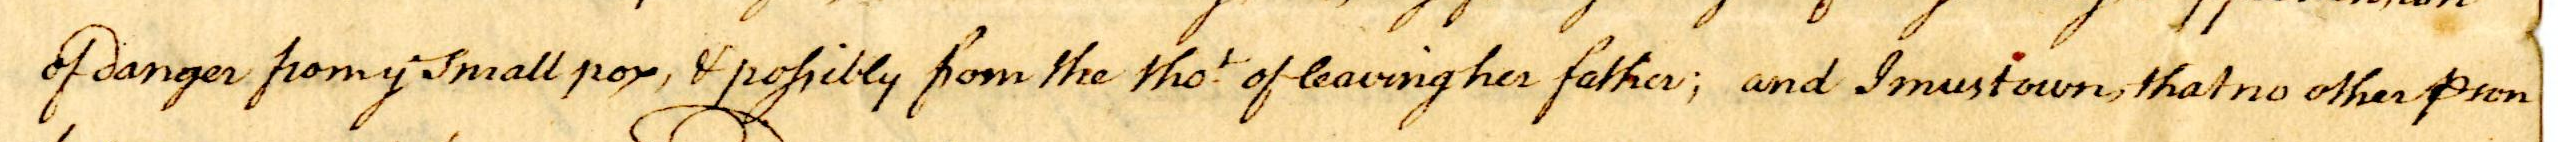of danger from y^e small pox, & possibly from the tho^t. of leaving her father; and I must own, that no other pson
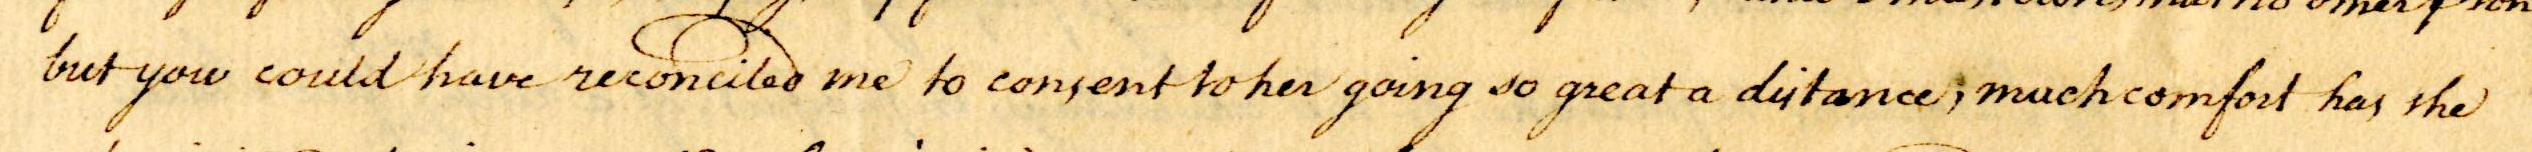but you could have reconciled me to consent to her going so great a distance, much comfort has she
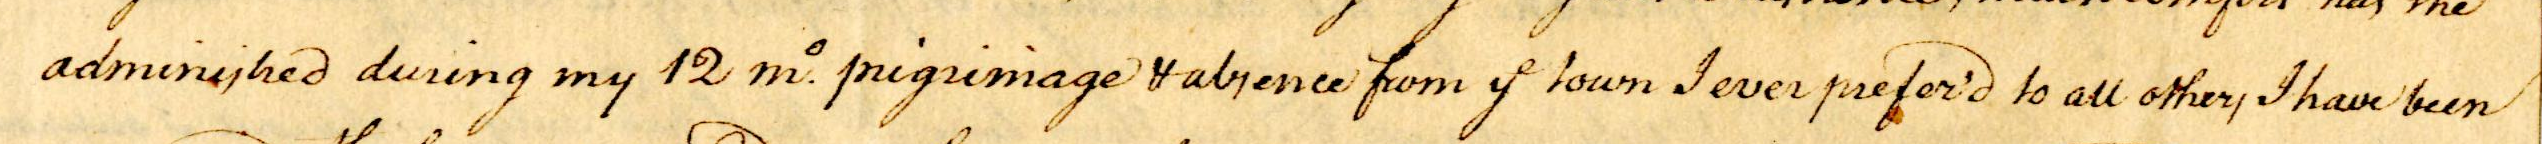administred during my 12 m^o. prigrimage & absence from y^e town I ever prefer'd to all others I have been
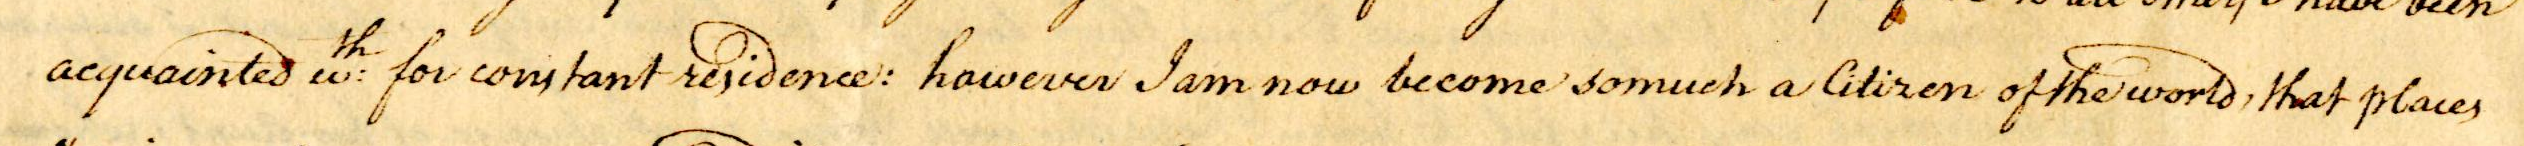acquainted w^th: for constant residence: however I am now become so much a Citizen of the world, that places
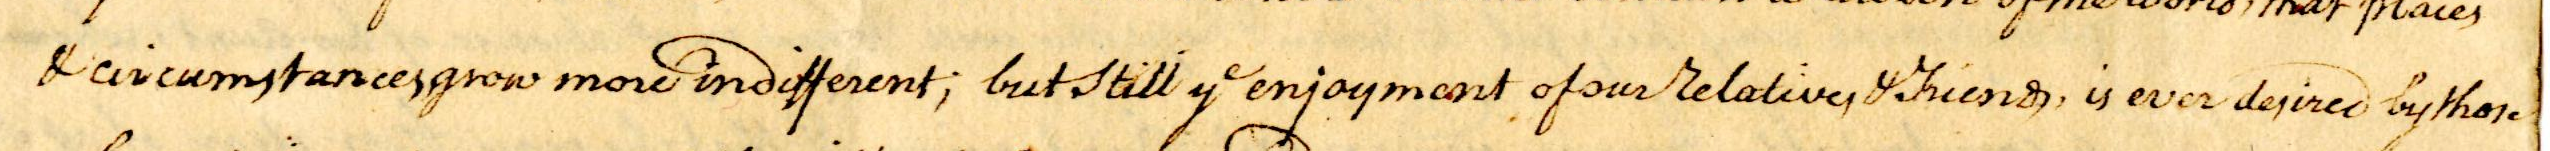& circumstances grow more indifferent; but Still y^e enjoyment of our relatives & Friends, is ever desired by those
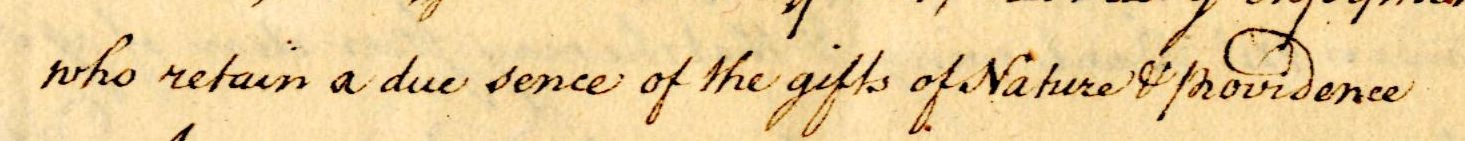who retain a due sence of the gifts of Nature & providence
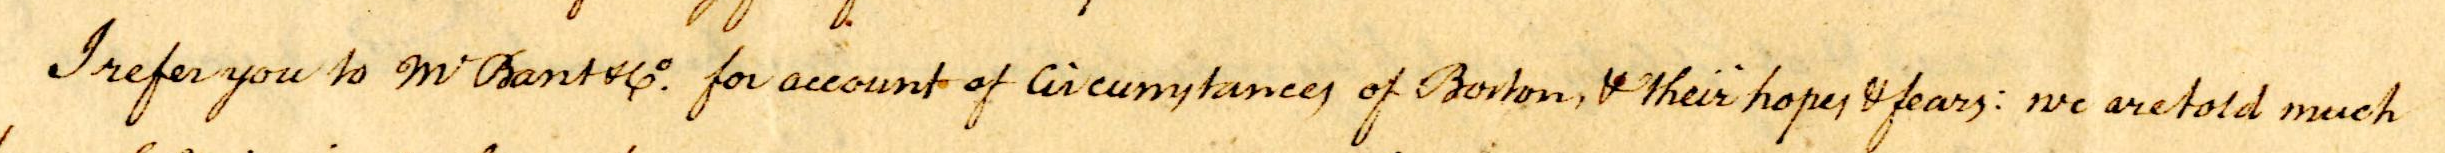I refer you to M Bant & C^o. for account of Circumstances of Boston, & their hopes & fears: we are told much
